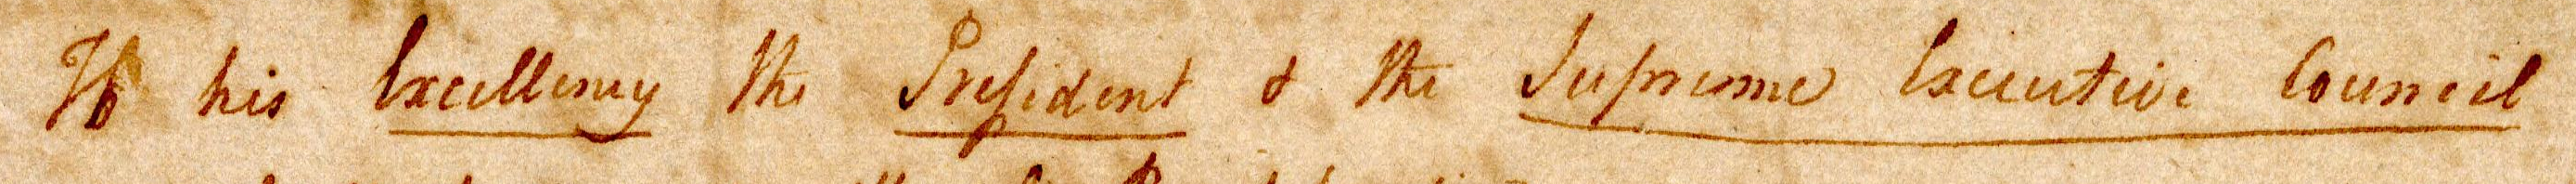To his Excellency the President & the Supreme Executive Council
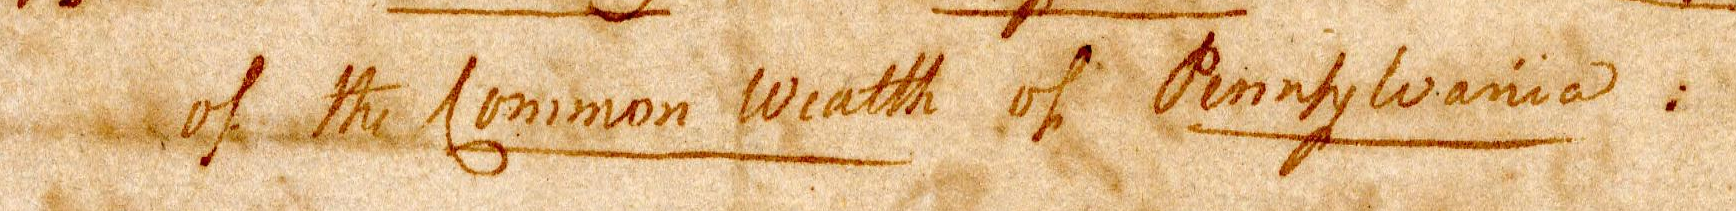of the Common Wealth of Pennsylvania
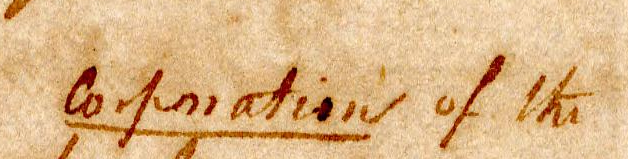Confirmation of the
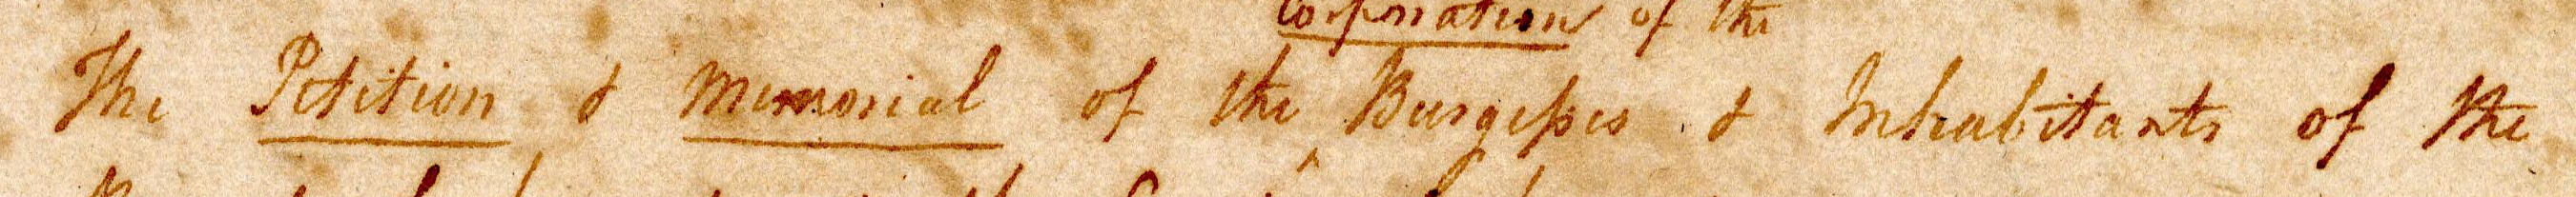The Petition & memorial of the ^ Burgesses & Inhabitants of the
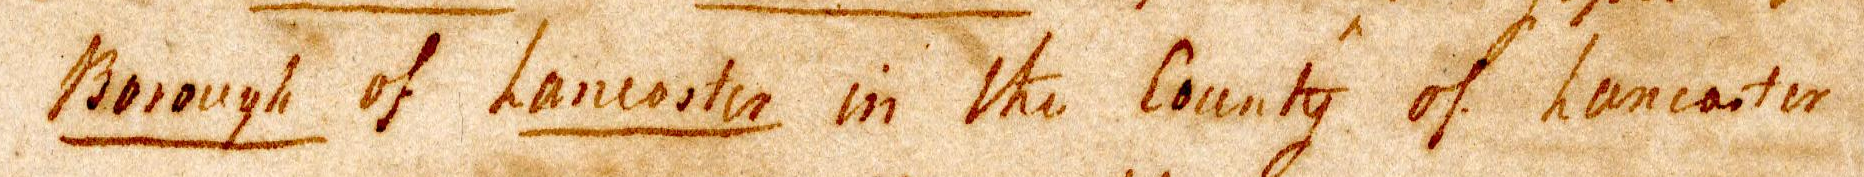Borough of Lancaster in the County of Lancaster
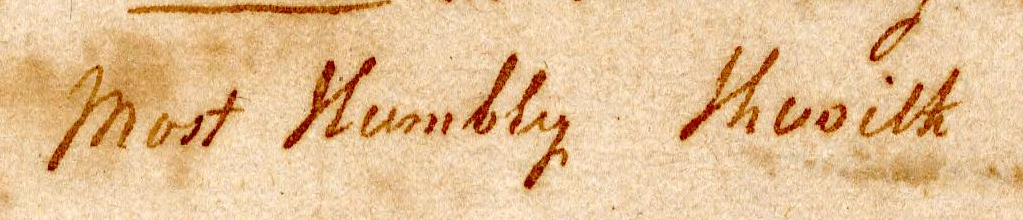Most Humbly shwith
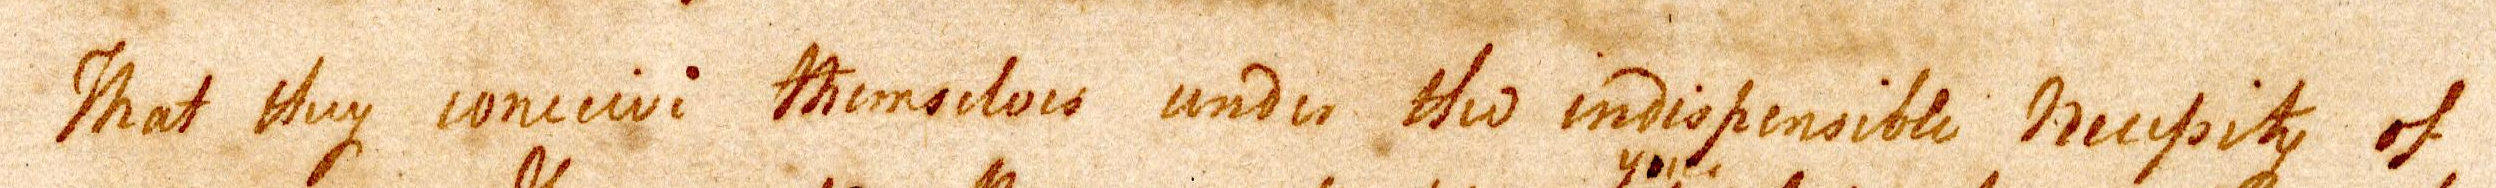That they conceive themselves under the indispensible necessity of
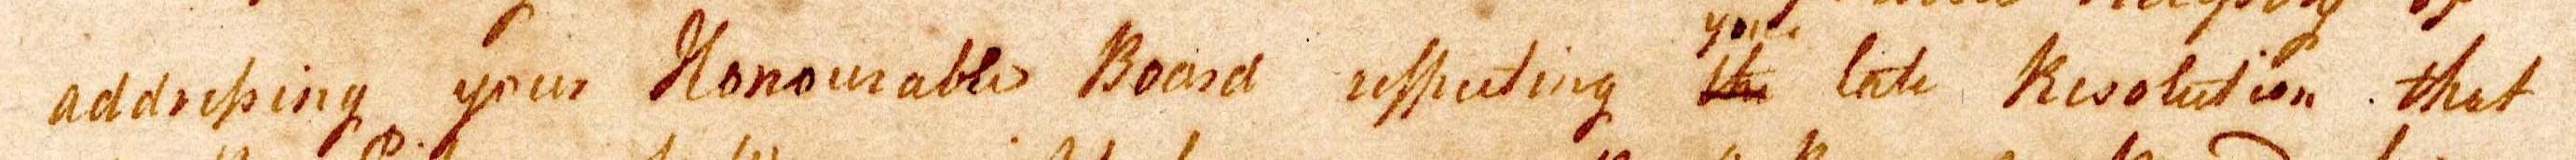addressing your Honourable Board, respecting the ^ late Resolution that
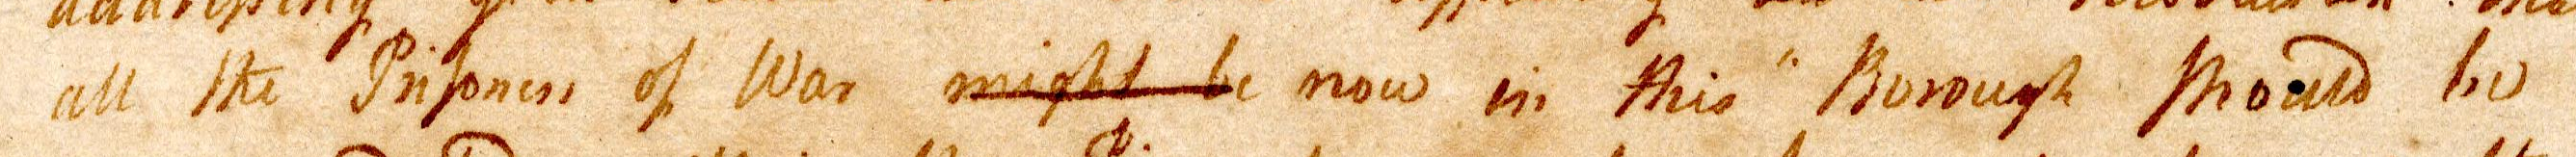all the Prisoners of War might be now in this Borough should be
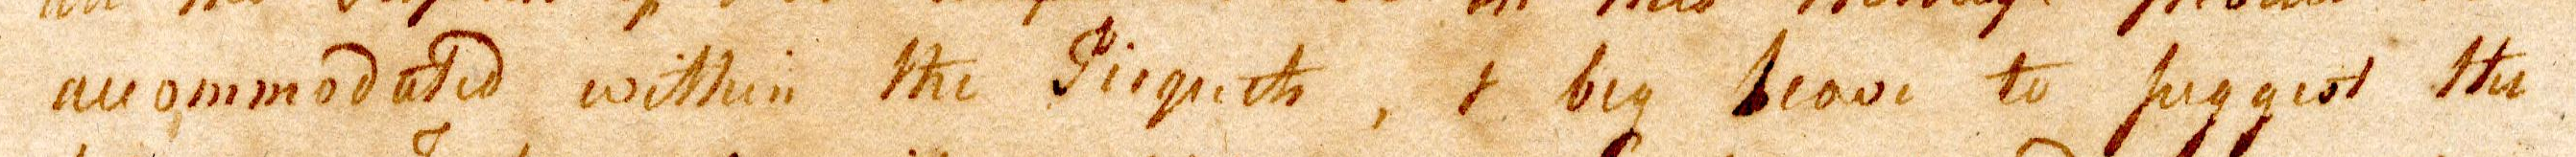accommodated within the Picquets, & beg leave to suggest the
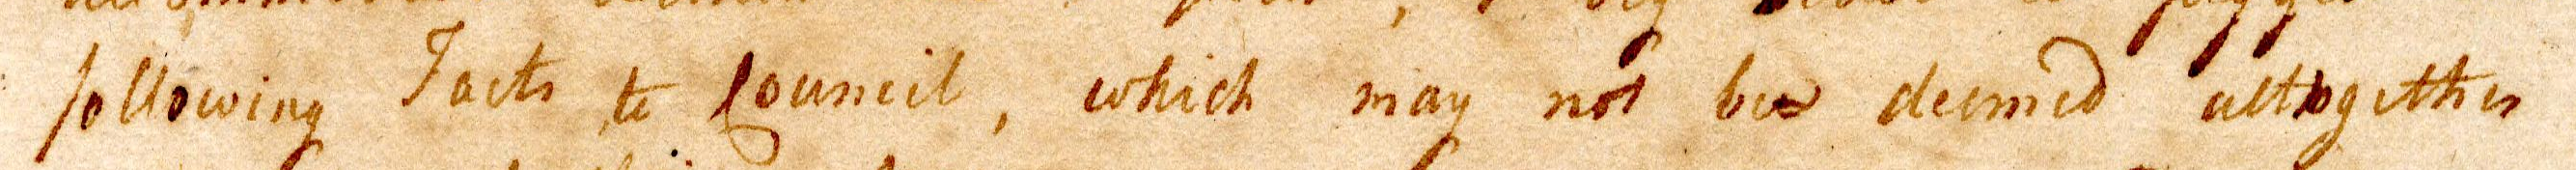following Facts to Council, which may not be deemed altogether
